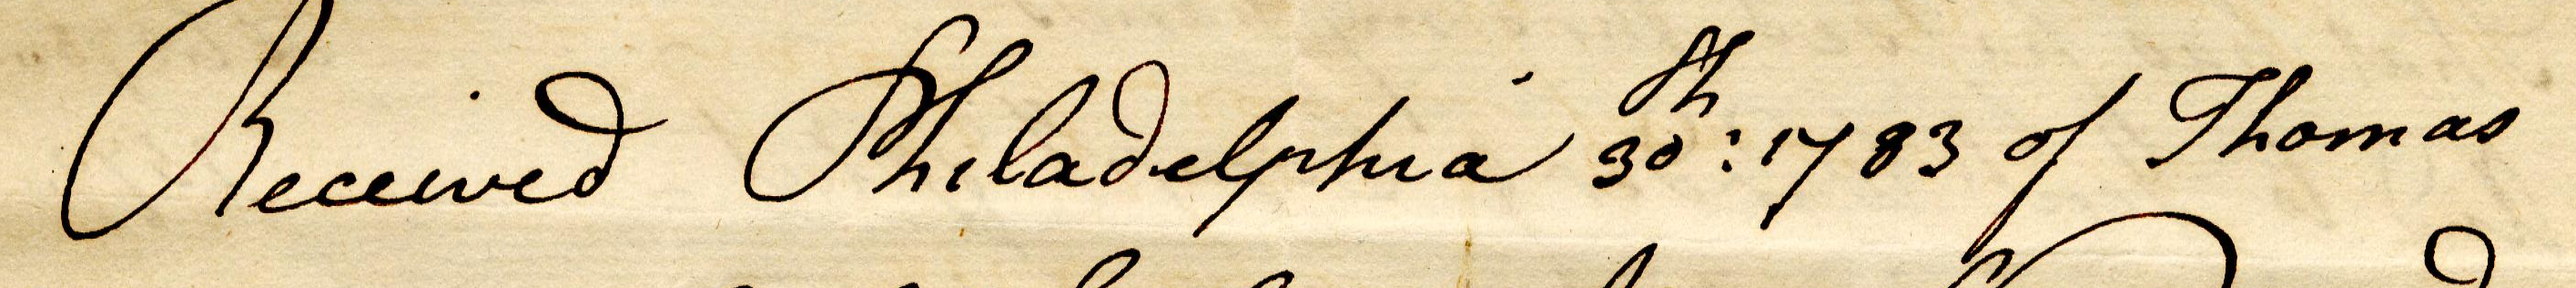Received Philadelphia 30^the: 1783 of Thomas
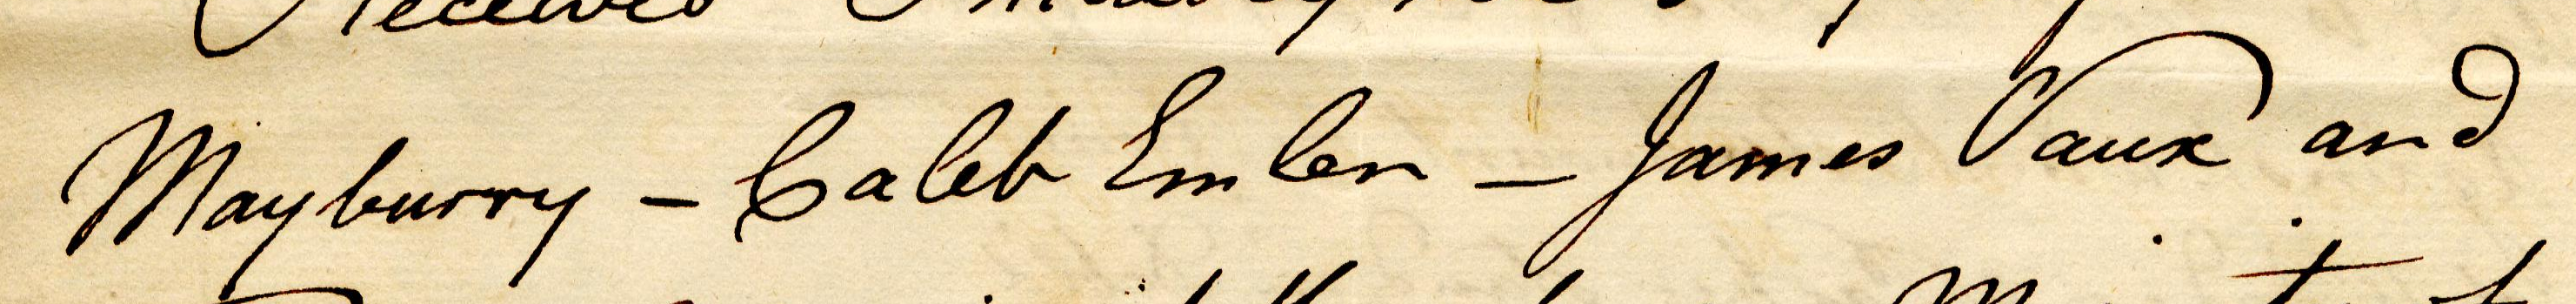Mayburry- Caleb Emlen- James Vaux and
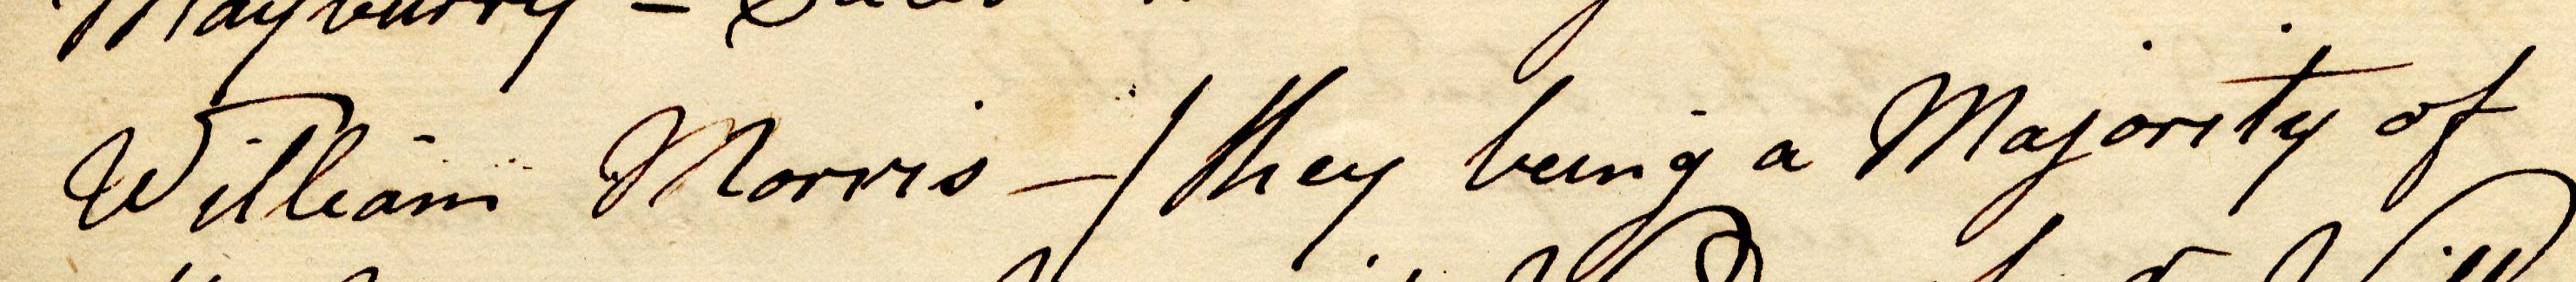William Morris- / they being a Majority of
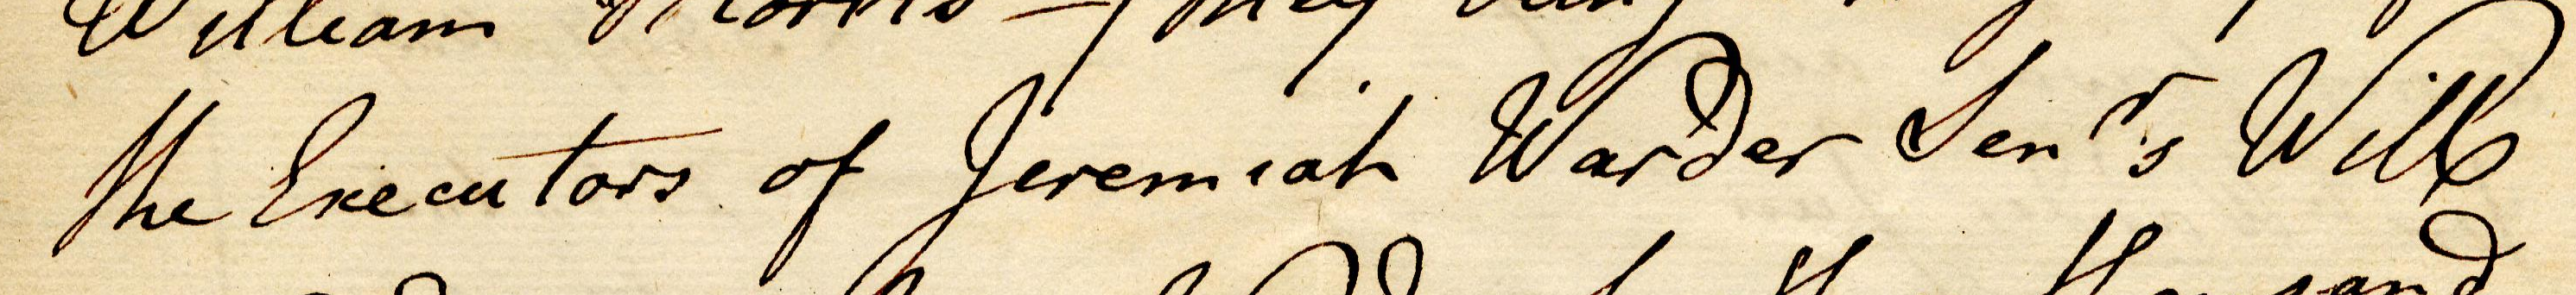the Executors of Jeremiah Warder Sen^r's Will
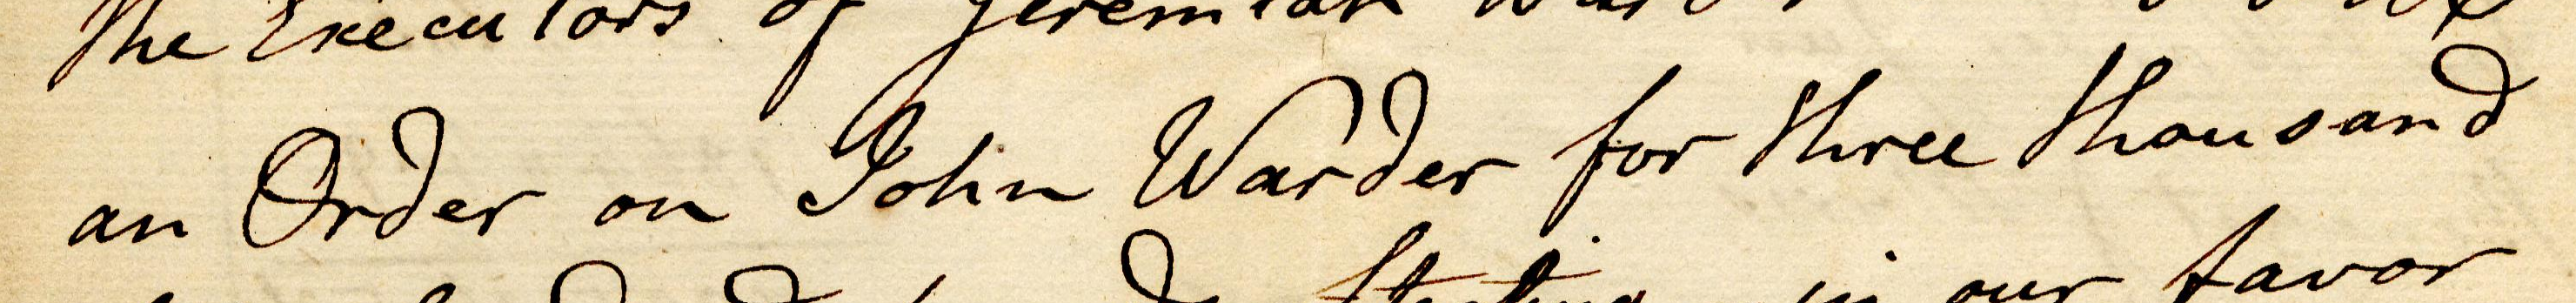an Order on John Warder for three thousand
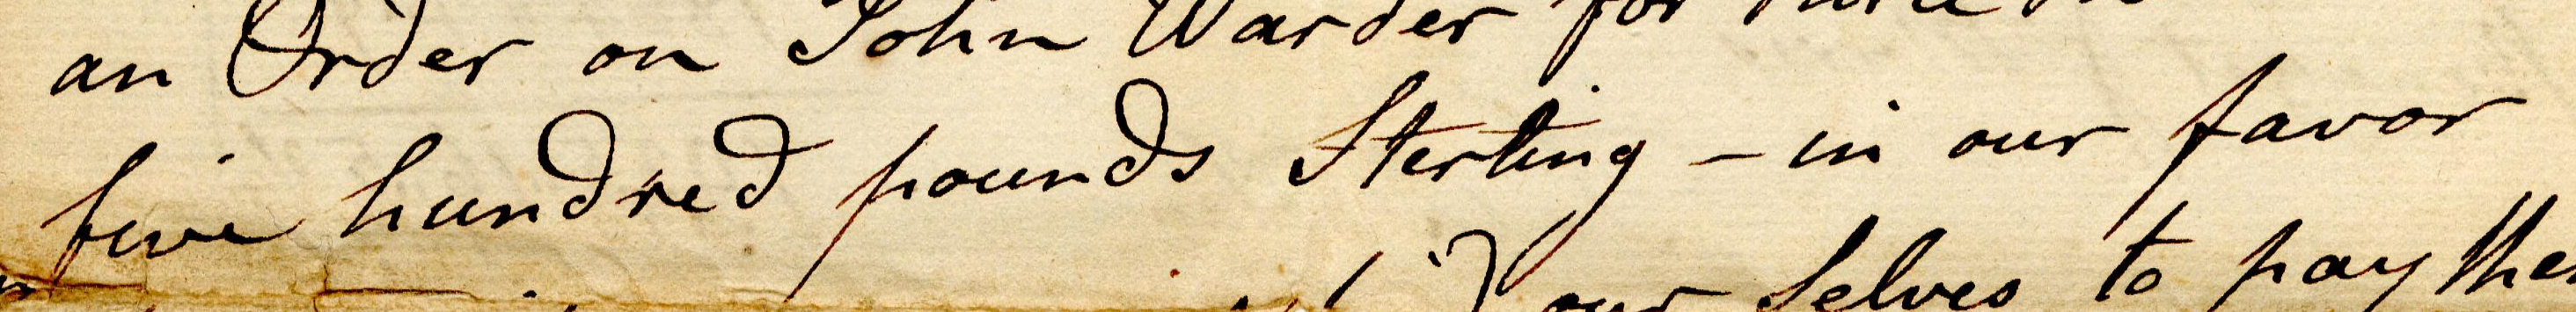five hundred pounds Sterling- in our favor
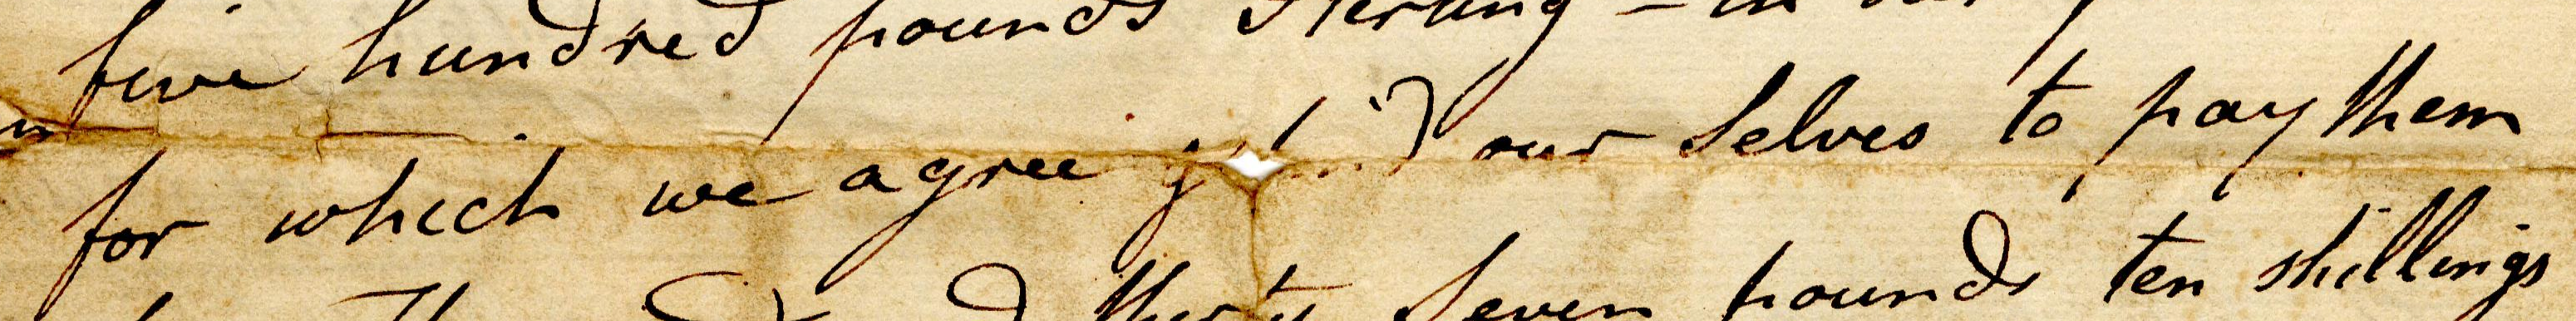for which we agree get our selves to pay them
